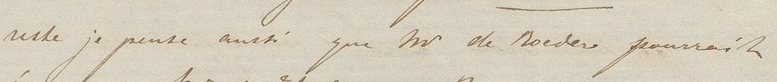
reste je pense aussi que Mr de Roeder pourrait
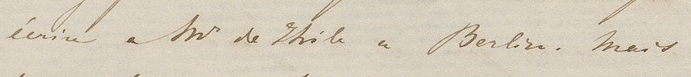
écrire a Mrde Thile a Berlin. Mais
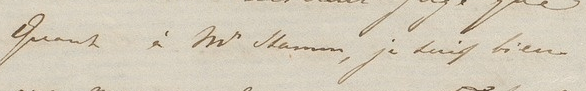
Quant à MrStamm, je suis bien
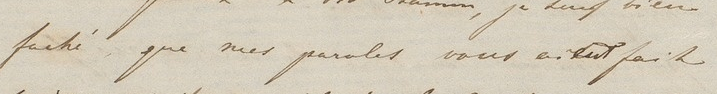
faché, que mes paroles vous ai eût fait
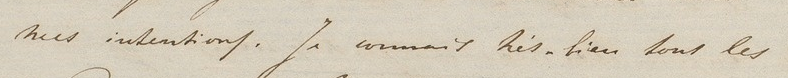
mes intentions. Je connais très-bien tous les
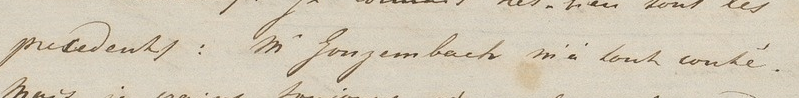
precedents: MrGonzembach m'à tout conté.
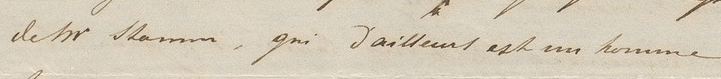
de MrStamm, qui d'ailleurs est un homme
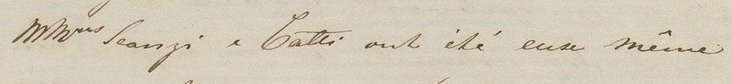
MMersScanzi & Tatti ont été eux même
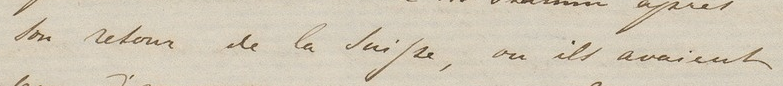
son retour de la Suisse, ou ils avaient
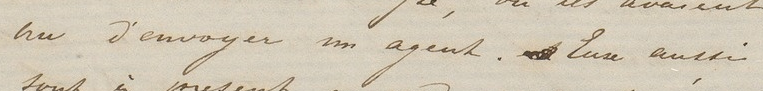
cru d'envoyer un agent. ... Eux aussi
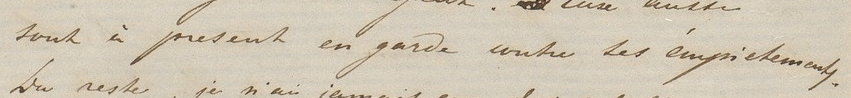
sont à present en garde contre ses émpietements.
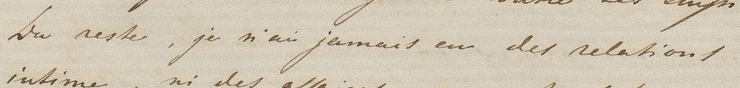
Du reste, je n'ai jamais eu des relations
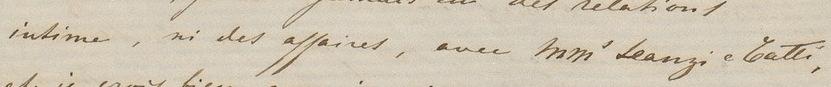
intime, ni des affaires, avec MMsScanzi e Tatti,
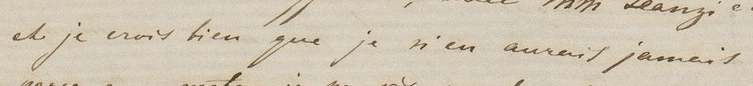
et je crois bien que je n'en aurauis jamais
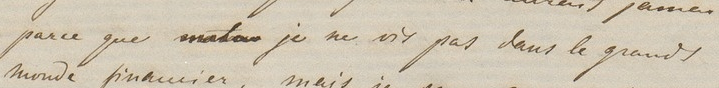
parce que ... je ne vis pas dans le grands
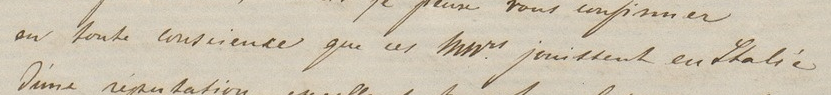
en toute conscience que ces MMrs jouissent en Italie
